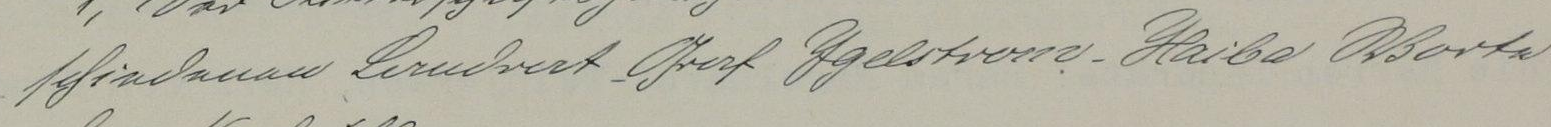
schiedenen Landrat Graf Igelstrom-Haiba Worte
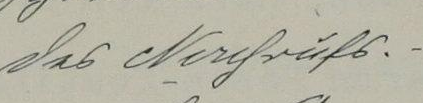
des Nachrufs.
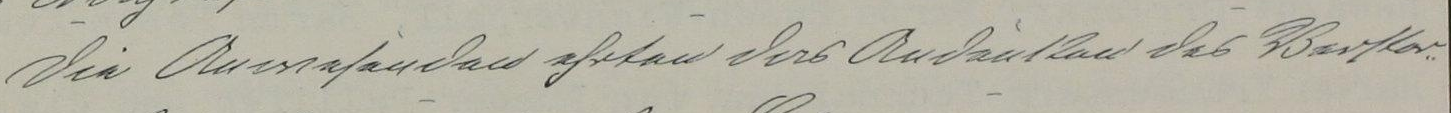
Die Anwesenden ehrten das Andenken des Verstor-
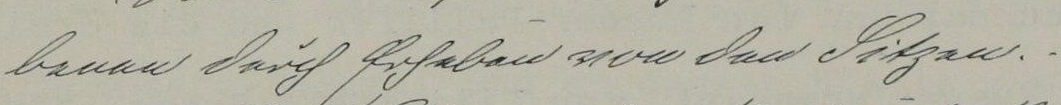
benen durch Erheben von den Sitzen.
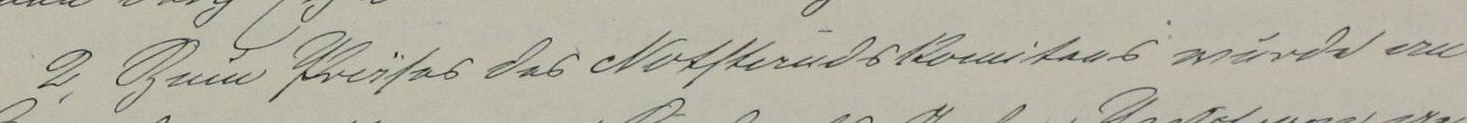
2. Zum Präses des Notstandskomitees wurde an
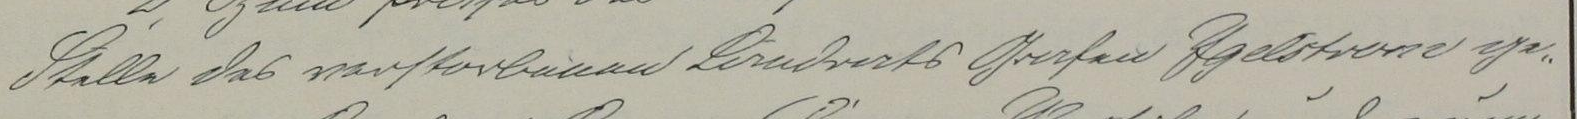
Stelle des verstorbenen Landrats Grafen Igelstrom ge-
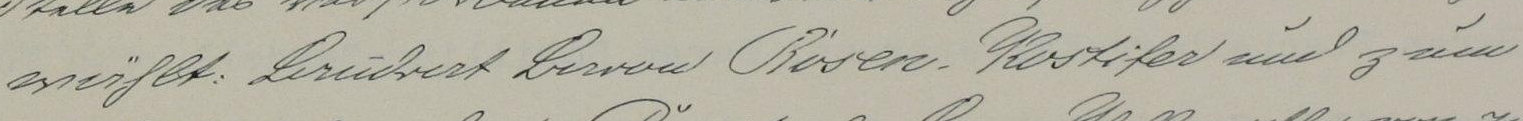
wählt: Landrat Baron Rosen-Kostifer und zum
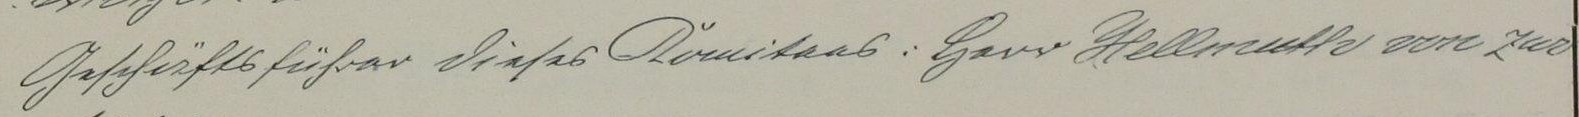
Geschäftsführer dieses Komitees: Herr Hellmuth von zur
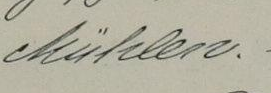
Mühlen.
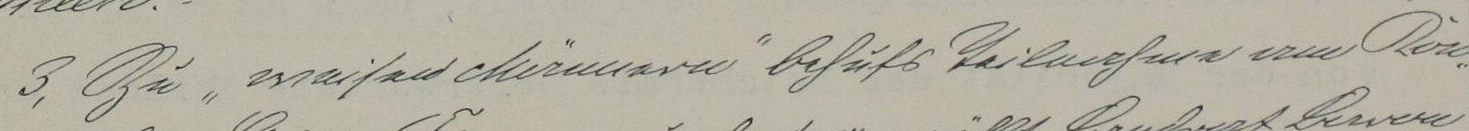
3. Zu „weisen Männern“ behufs Teilnahme am Kon-
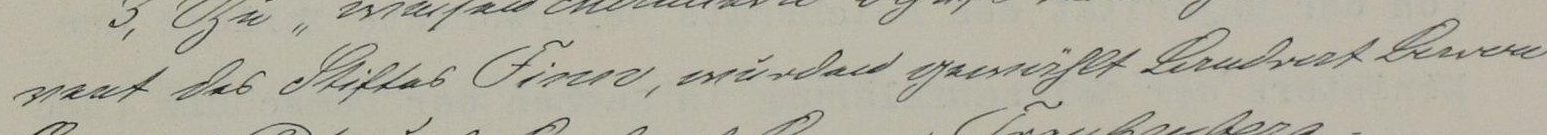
vent des Stiftes Finn, wurden gewählt Landrat Baron
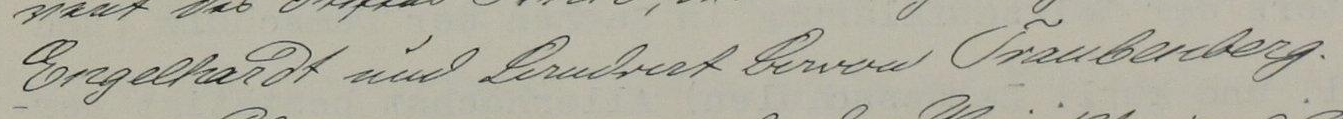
Engelhardt und Landrat Baron Traubenberg.
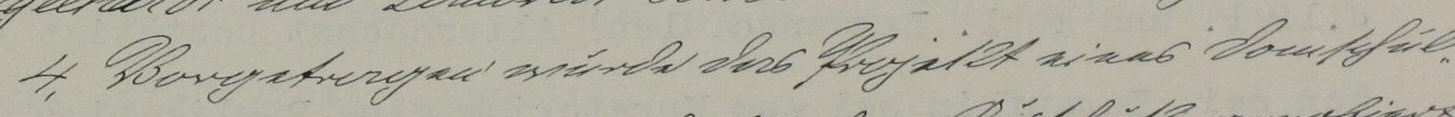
4. Vorgetragen wurde das Projekt eines Domschul-
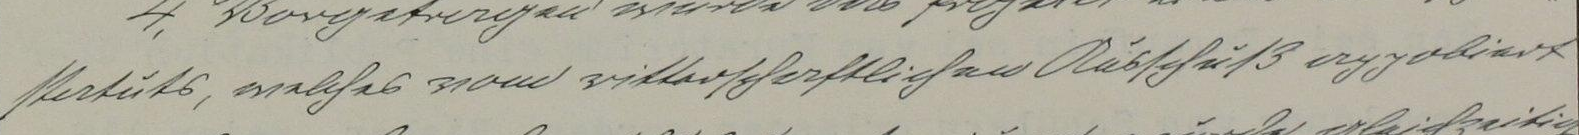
statuts, welches vom ritterschaftlichen Ausschuß appobiert
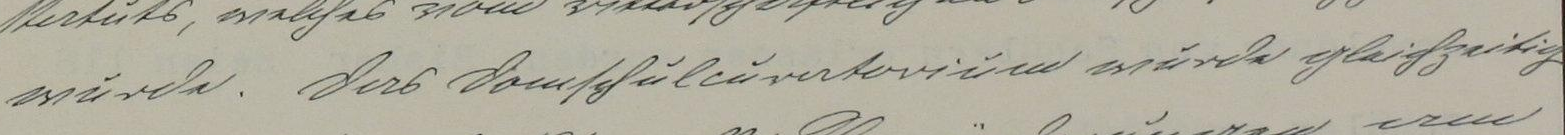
wurde. Das Domschulcuratorium wurde gleichzeitig
